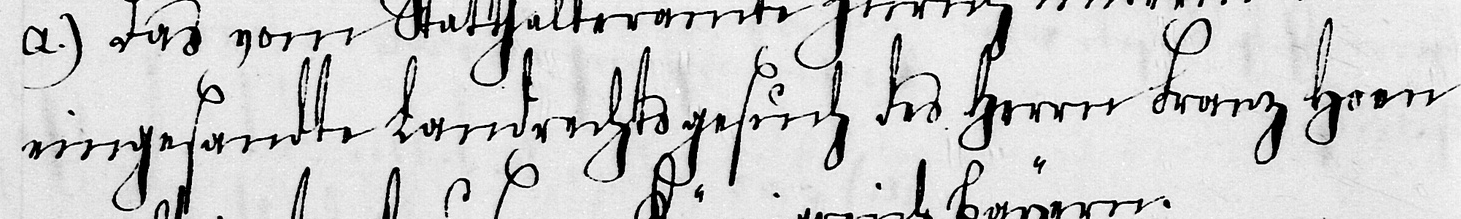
eingesandte Landrechtsgesuch des Herrn Franz Hoen
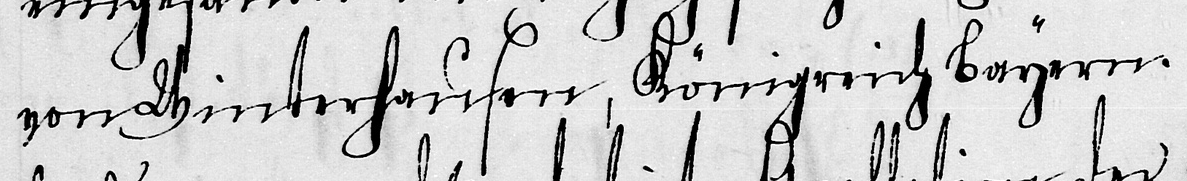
von Winterhausen, Königreich Bayern.
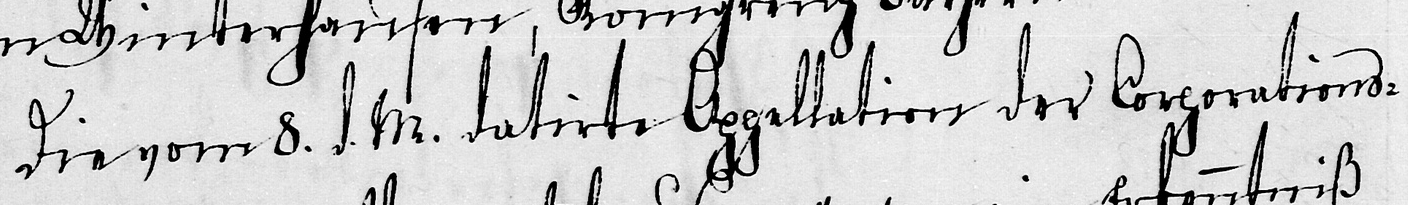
Die vom 8. d. M. datirte Appellation der Corporations¬
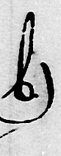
b.)
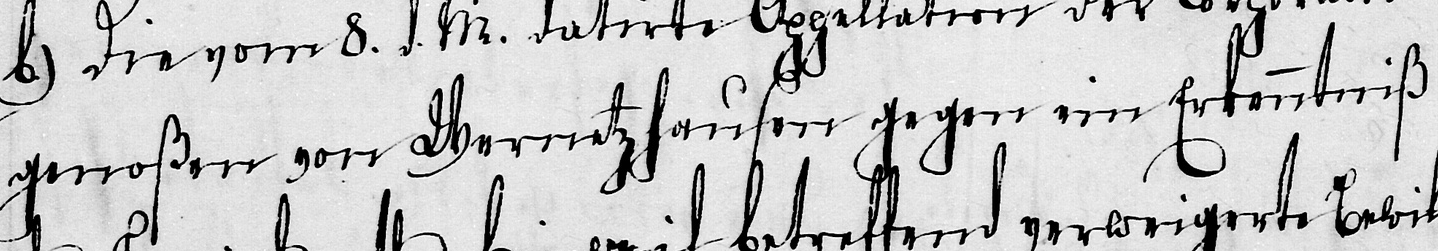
genoßen von Wernetzhausen gegen ein Erkenntniß
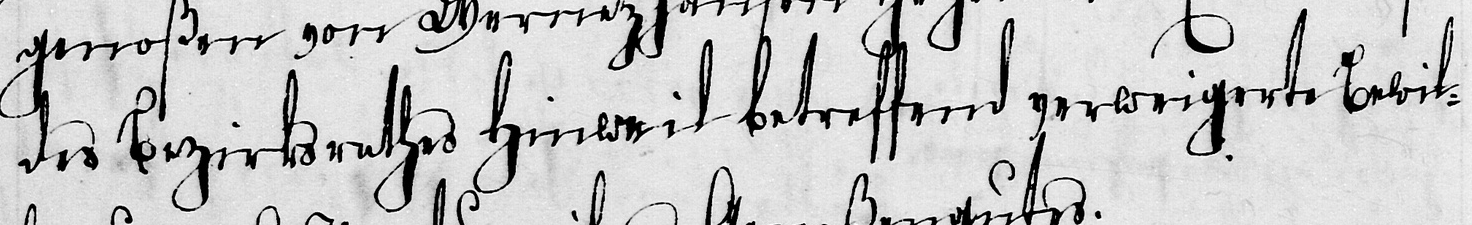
des Bezirksrathes Hinweil betreffend verweigerte Bewil¬
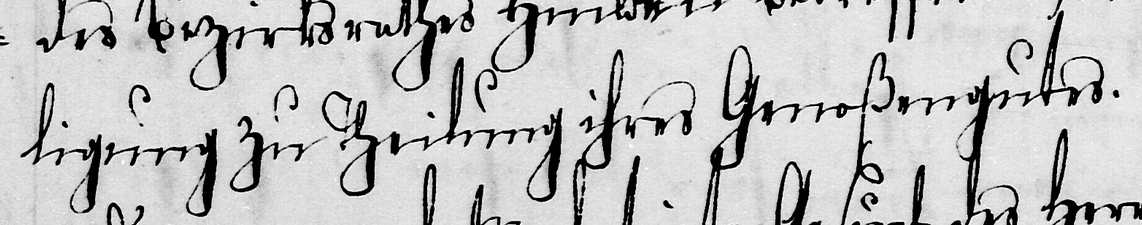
ligung zu Theilung ihres Genoßengutes.
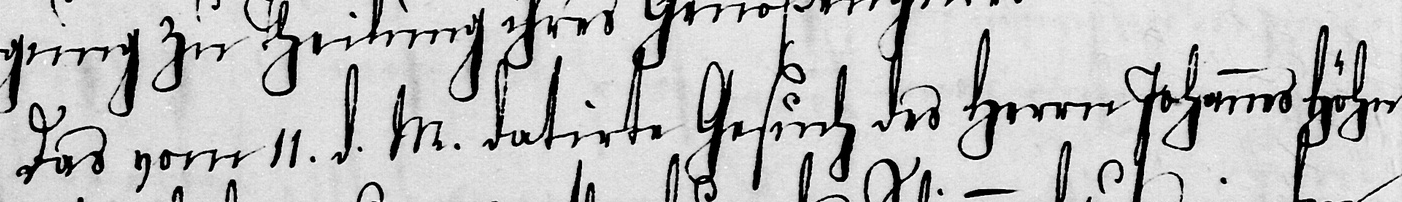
Das vom 11. d. M. datirte Gesuch des Herrn Johannes Hö¬
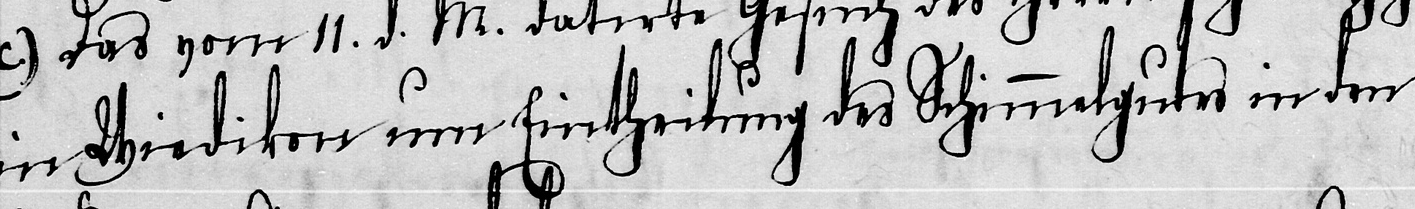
in Wiedikon um Eintheilung des Schimmelgutes in den
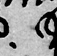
c.)
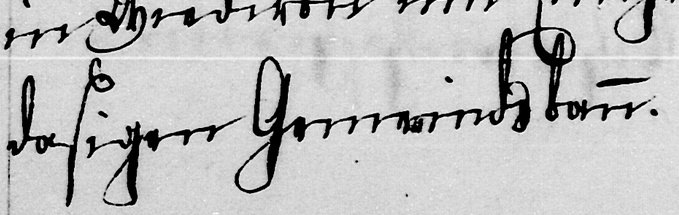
dasigen Gemeindsbann.
